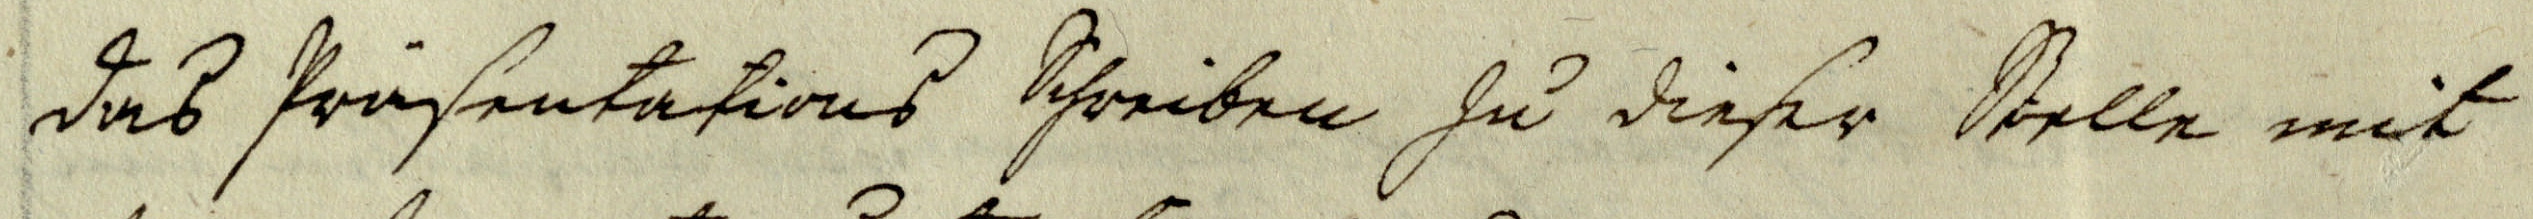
das Präsentations Schreiben zu dieser Stelle mit
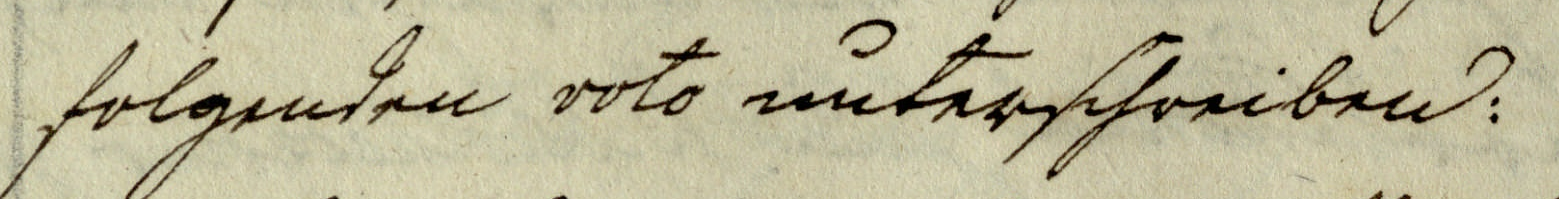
folgenden voto unterschreiben:
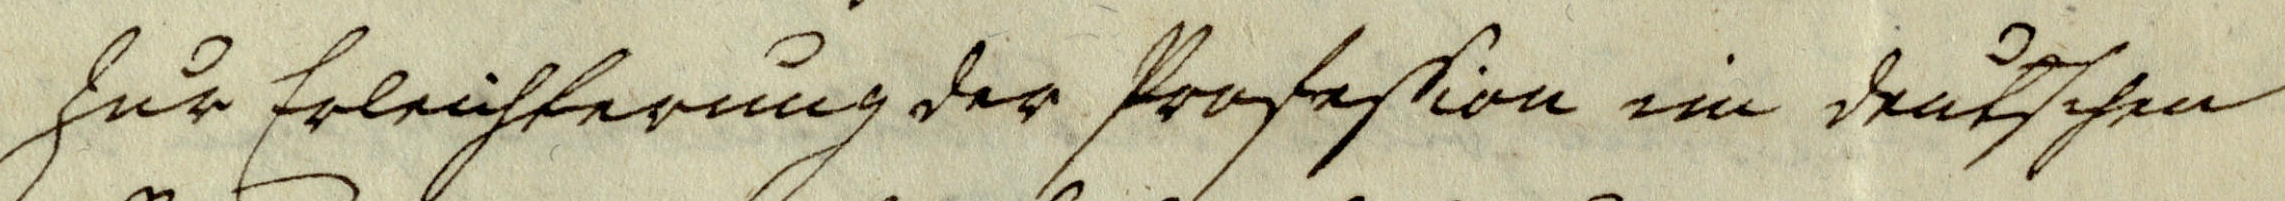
Zur Erleichterung der Profession im deutschen
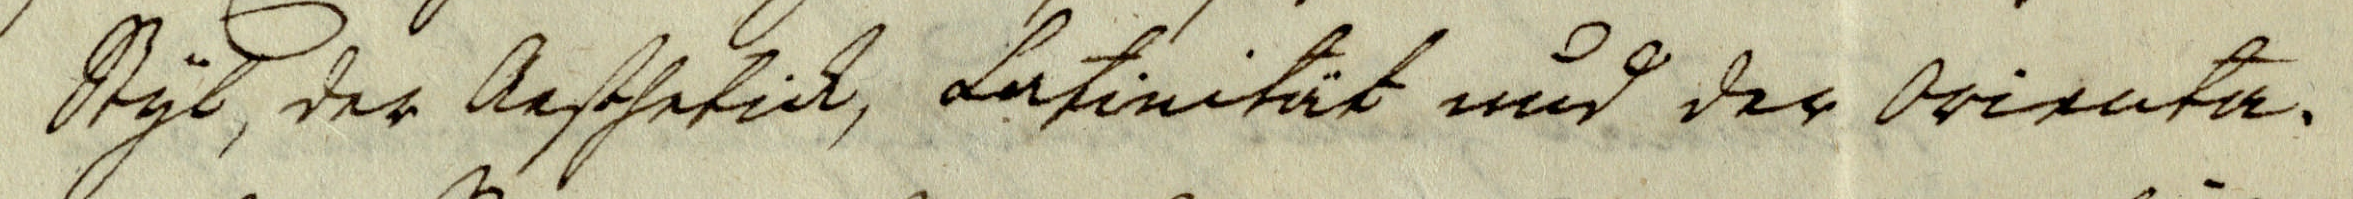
Stÿl, der Aesthetick, Latinität und der Orienta¬
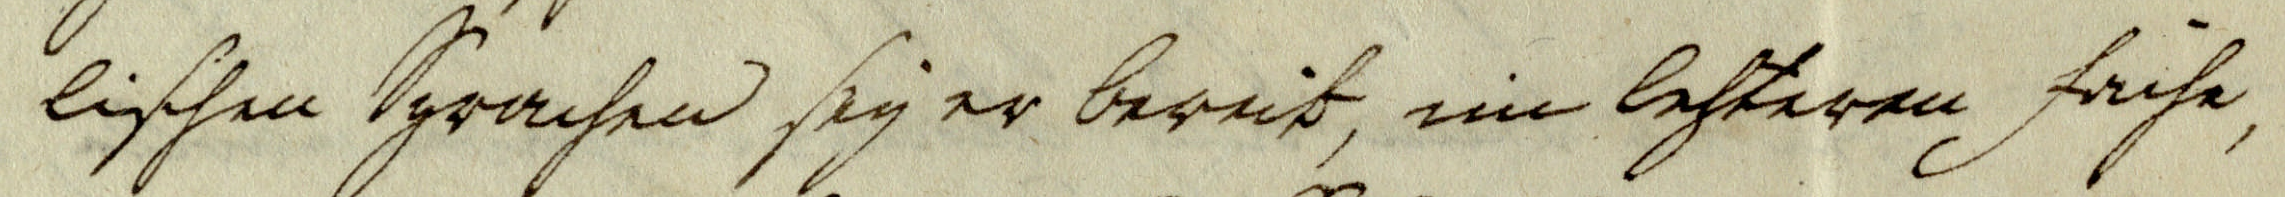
lischen Sprachen seÿ er bereit, im letzteren Fache,
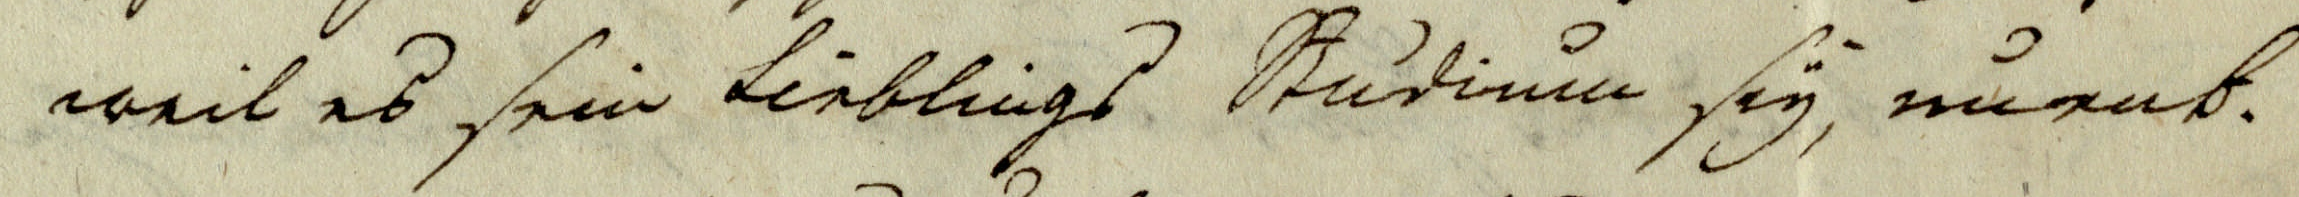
weil es sein Lieblings Studium seÿ, unent¬
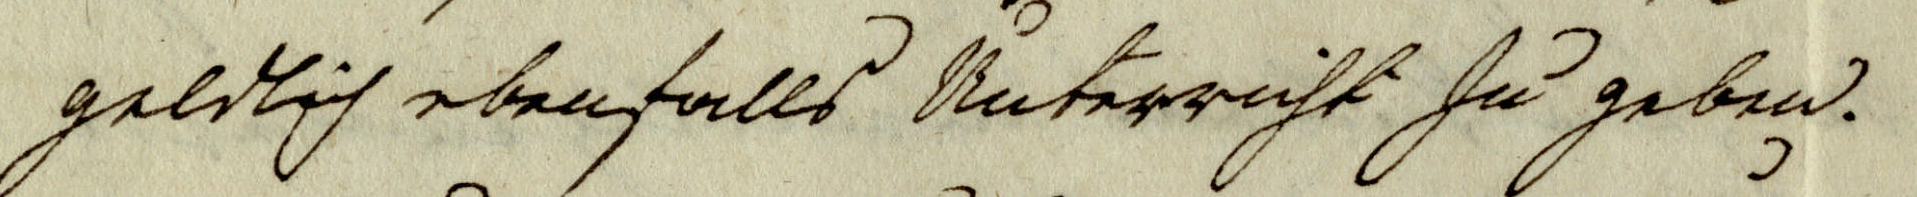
geldlich ebenfalls Unterricht zu geben.
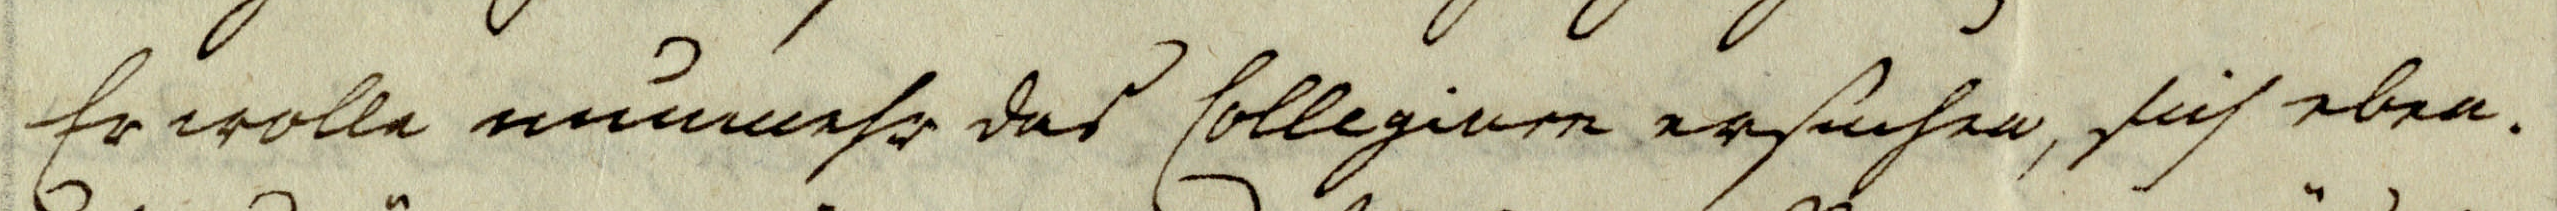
Er wolle nunmehr das Collegium ersuchen, sich eben¬
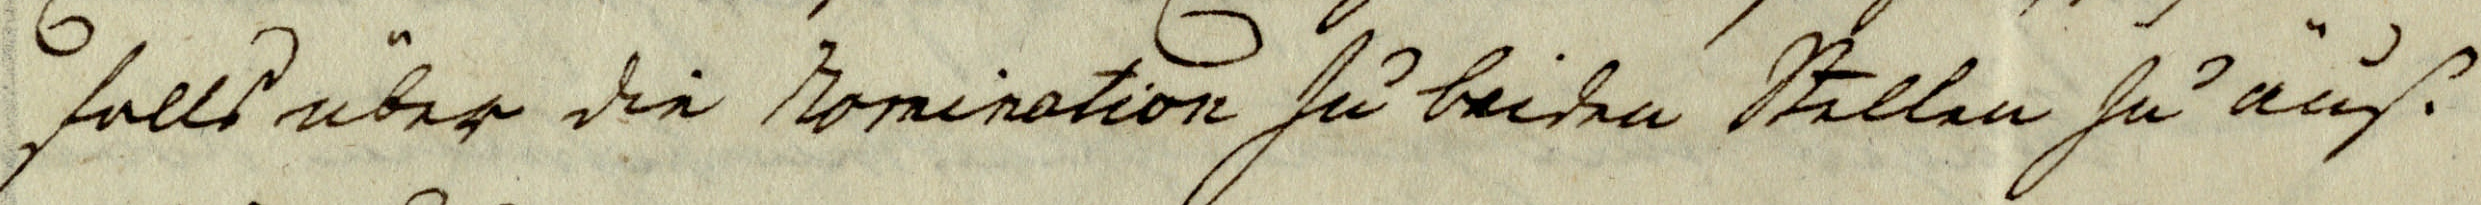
falls über die Nomination zu beiden Stellen zu äus¬
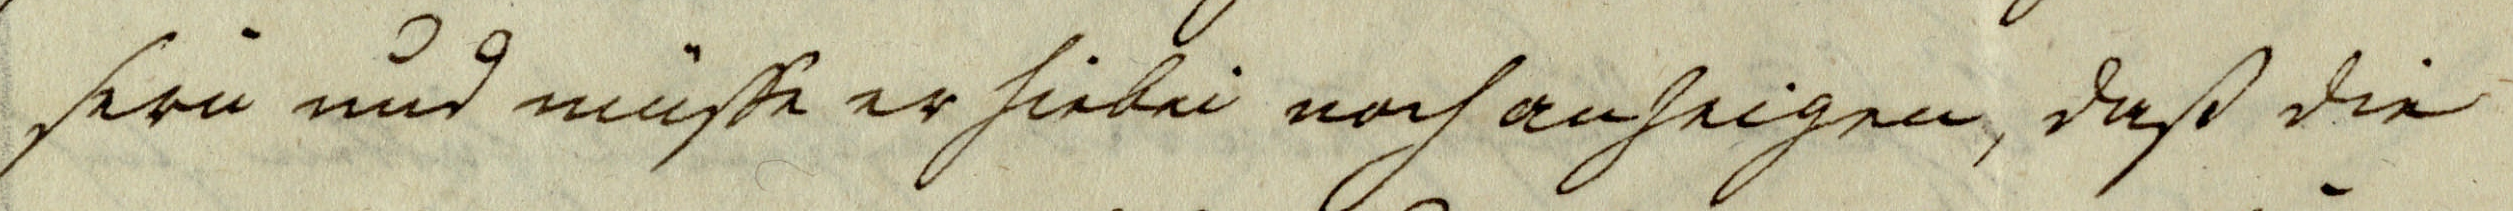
sern und müsse er hiebei noch anzeigen, daß die
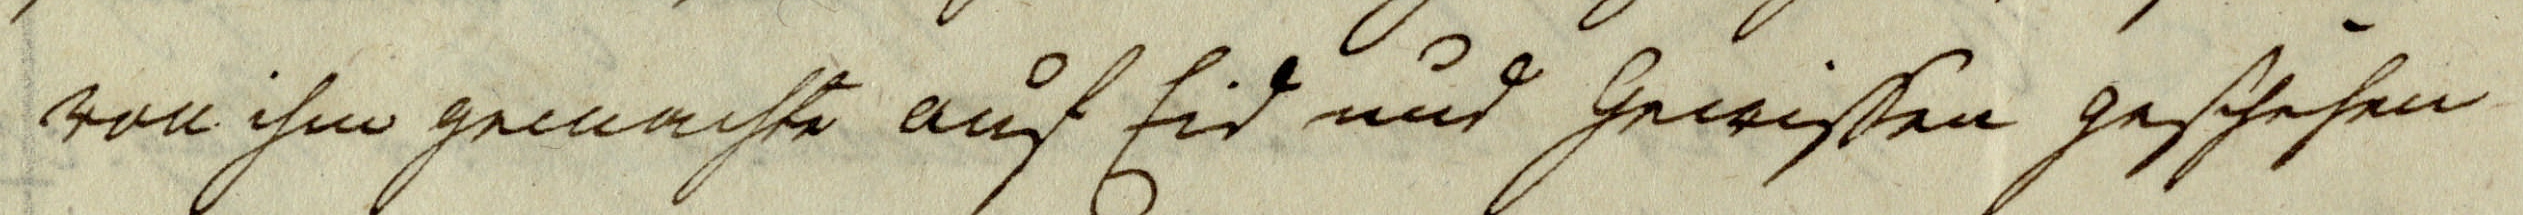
von ihm gemachte auf Eid und Gewissen geschehen
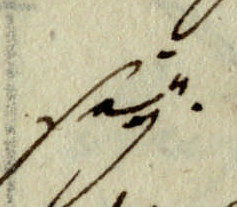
seÿ.
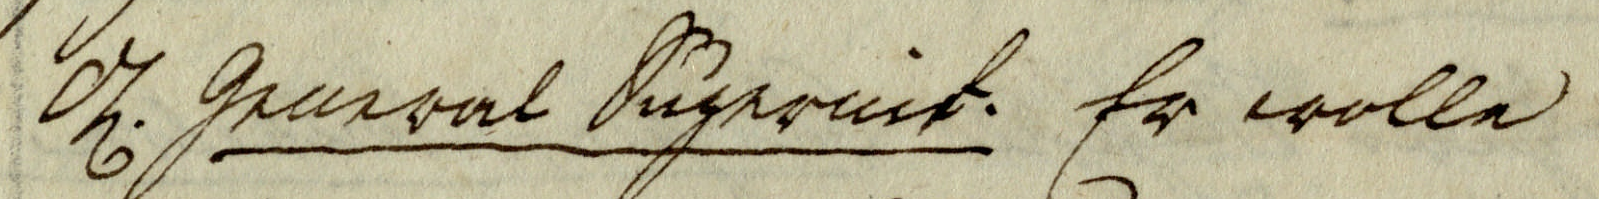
dh. General Superint. Er wolle
